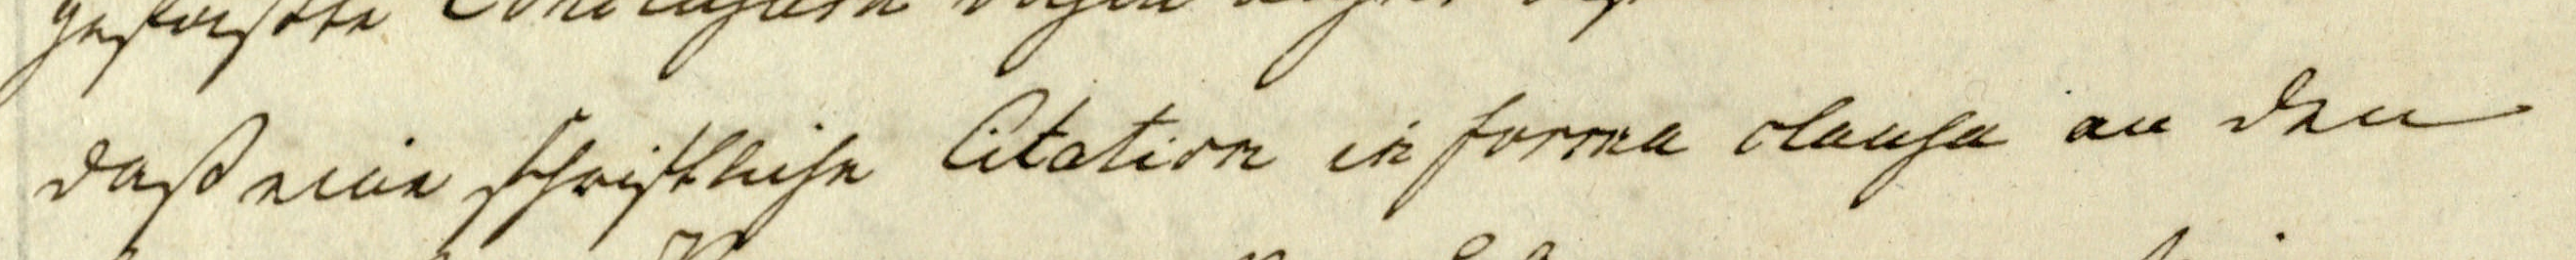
daß eine schriftliche Citation in forma clausa an den
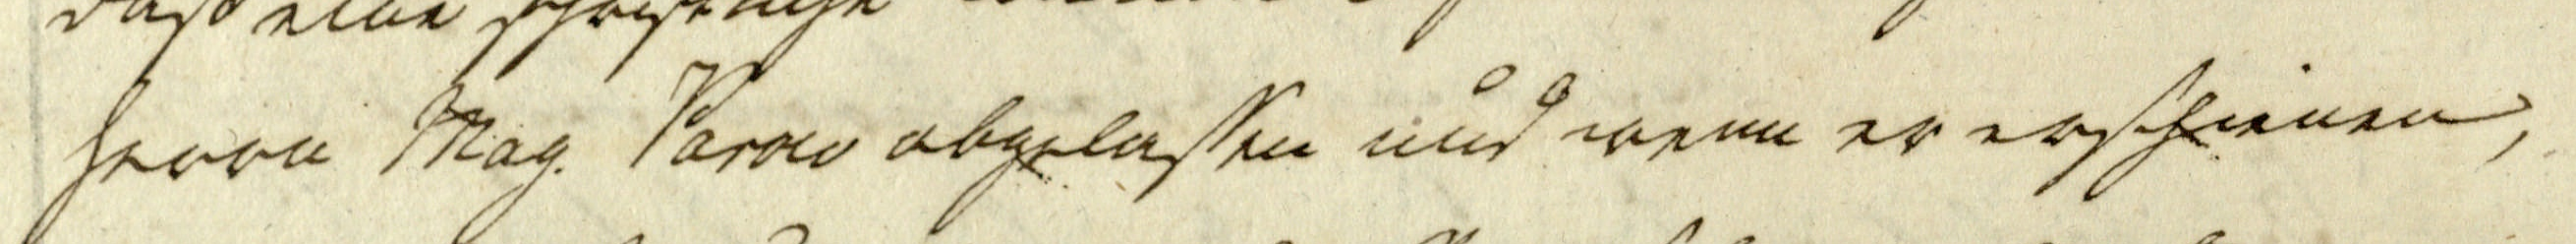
herrn Mag. Parow abgelassen und wenn er erschienen,
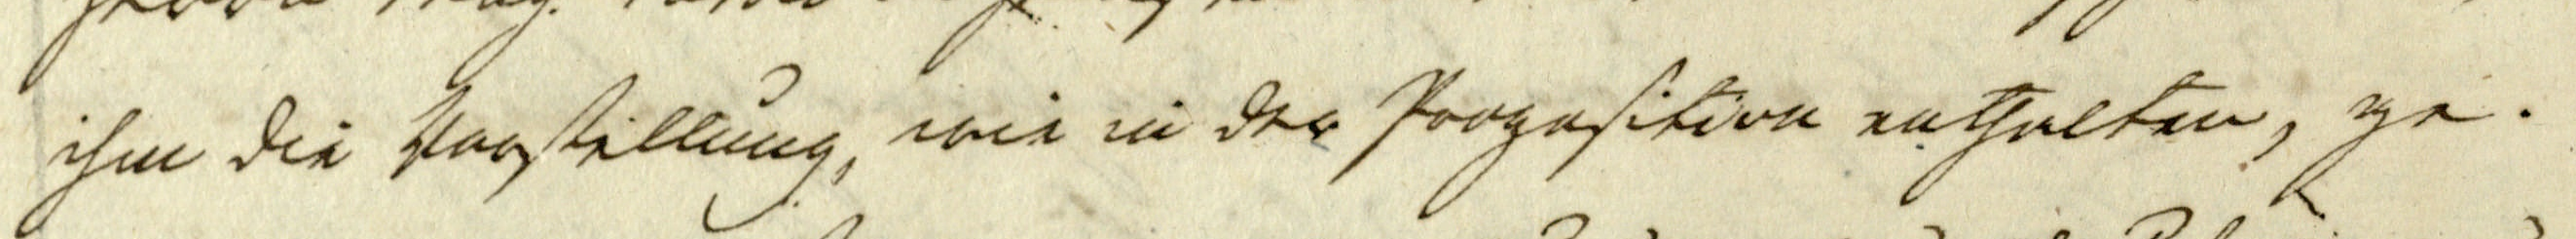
ihm die Vorstellung, wie in der Proposition enthalten, ge¬
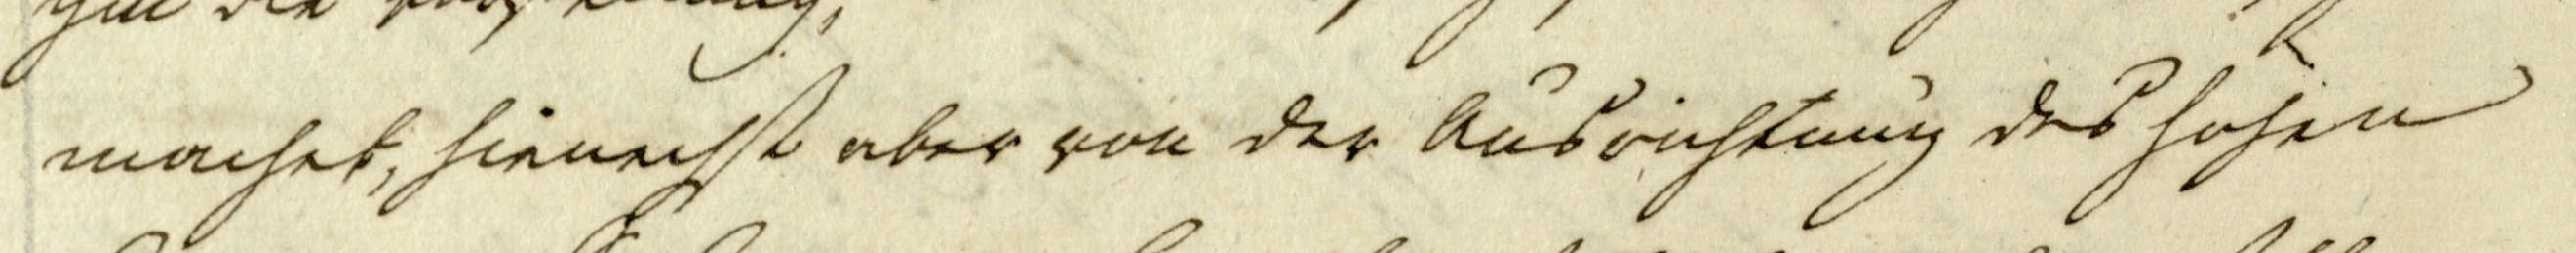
machet, hienechst aber von der Ausrichtung des hohen
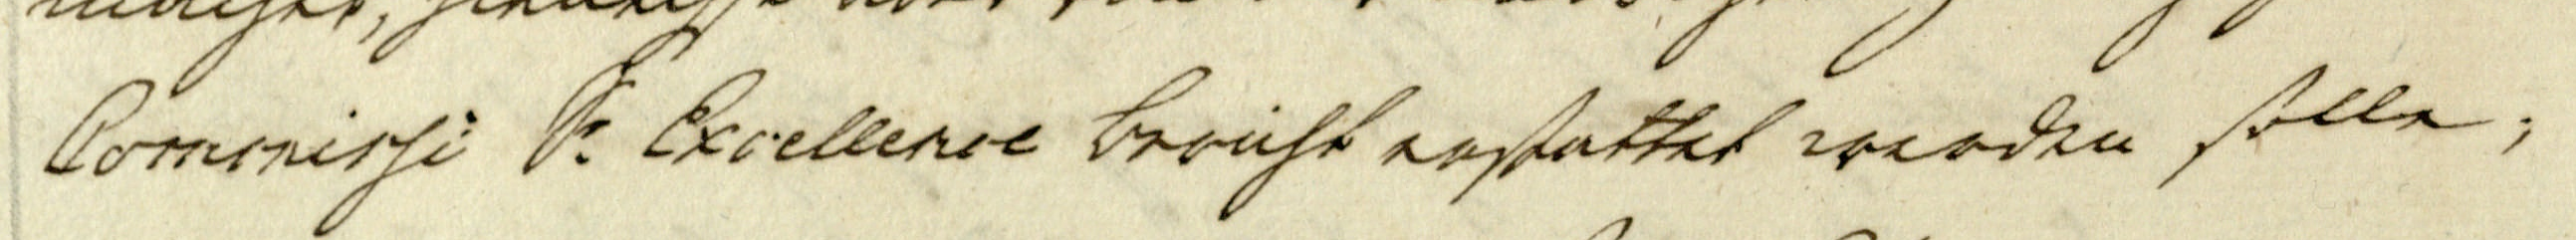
Commissi Sr. Excellence Bericht erstattet werden solle,
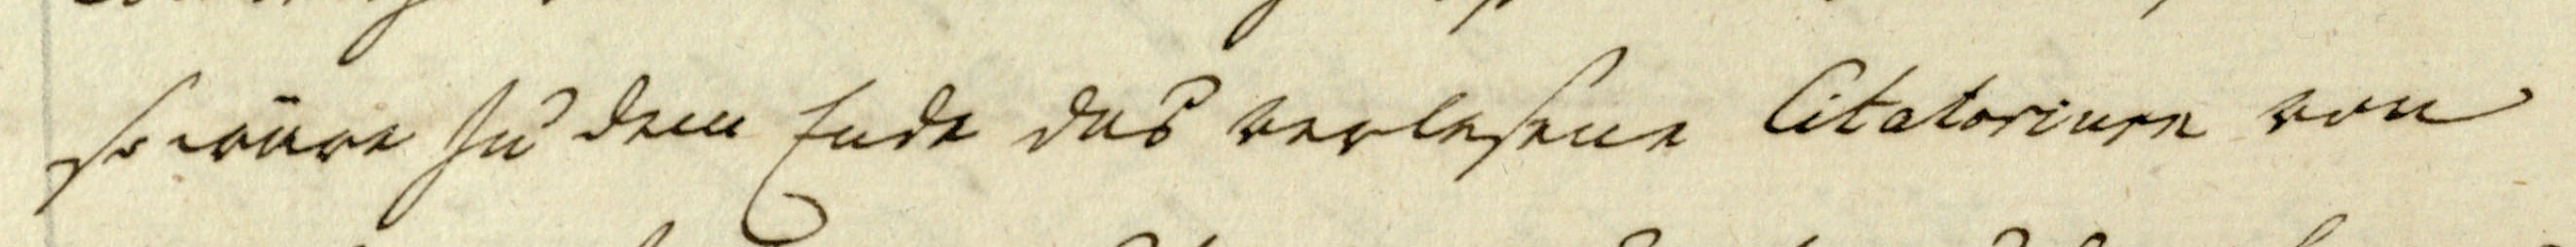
so wäre zu dem Ende das verlesene Citatorium von
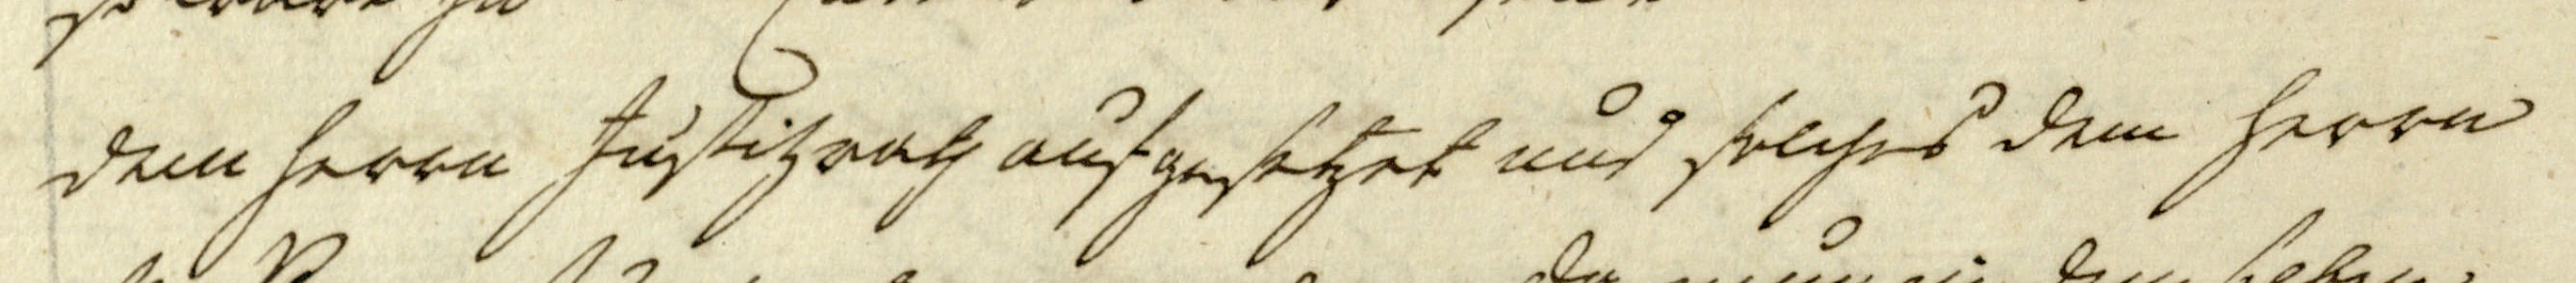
dem herrn Justizrath aufgesetzet und solches dem herrn
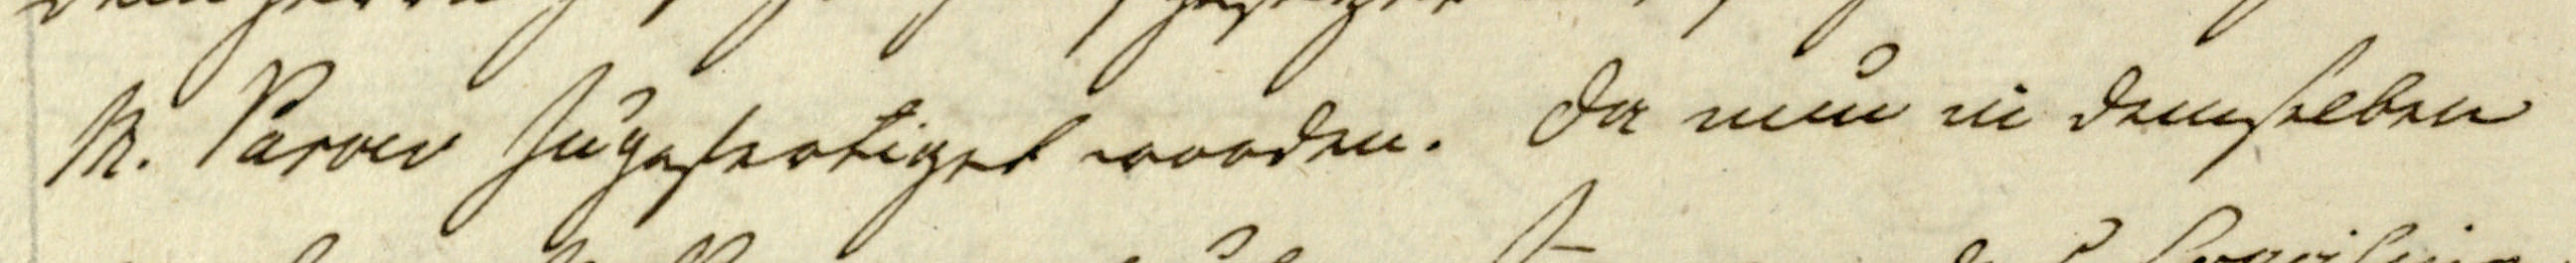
M. Parow zugefertiget worden. Da nun in demselben
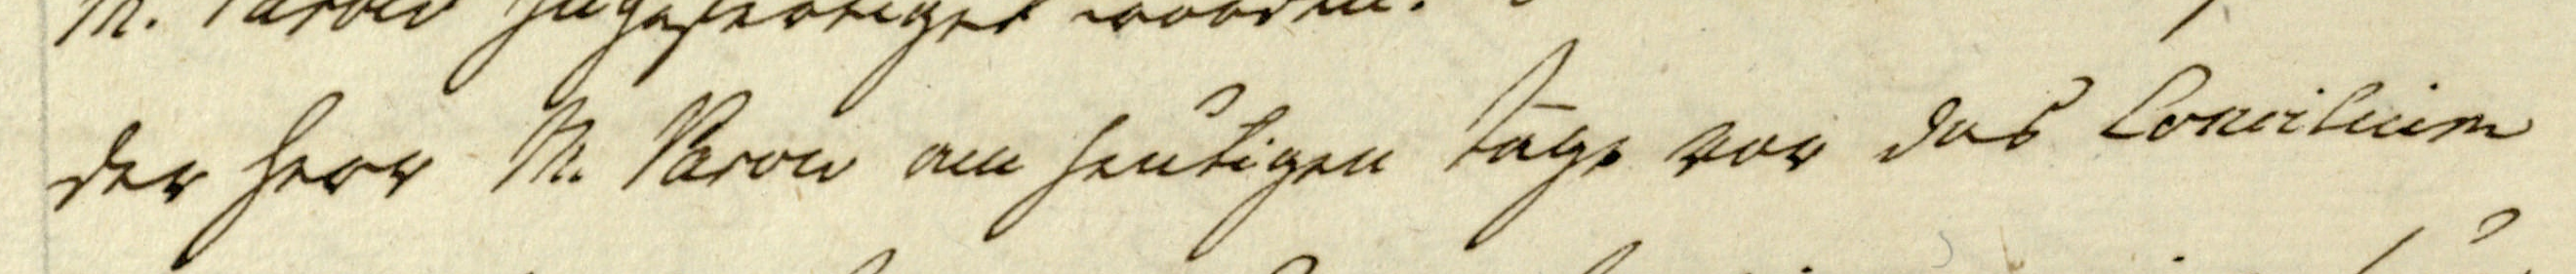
der herr M. Parow am heutigen Tage vor das Concilium
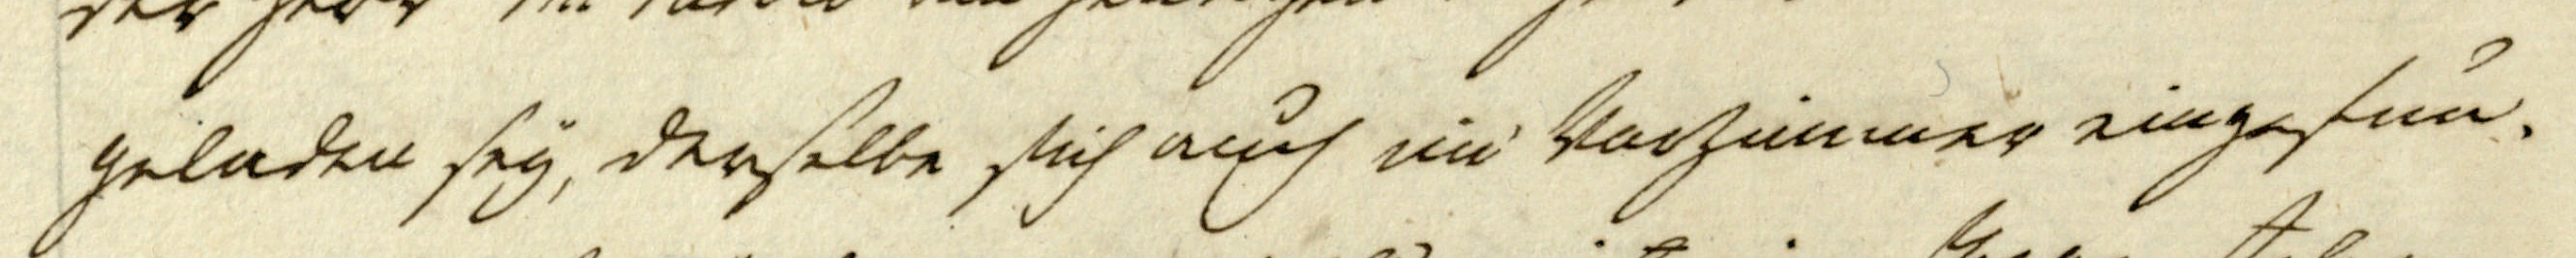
geladen seÿ, derselbe sich auch im Vorzimmer eingefun¬
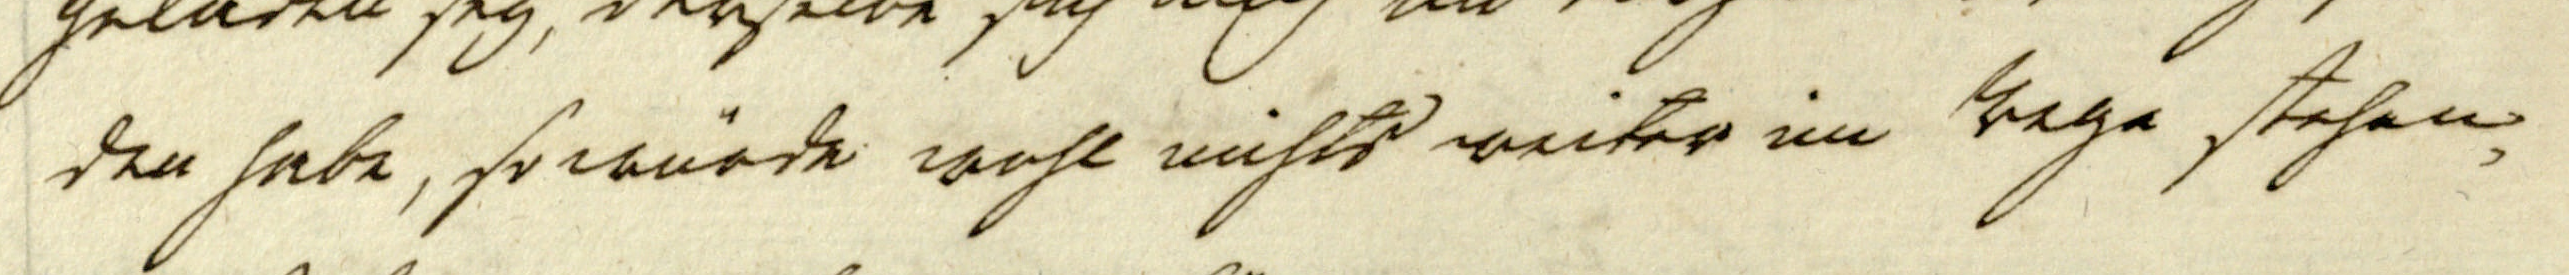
den habe, so würde wohl nichts weiter im Wege stehen,
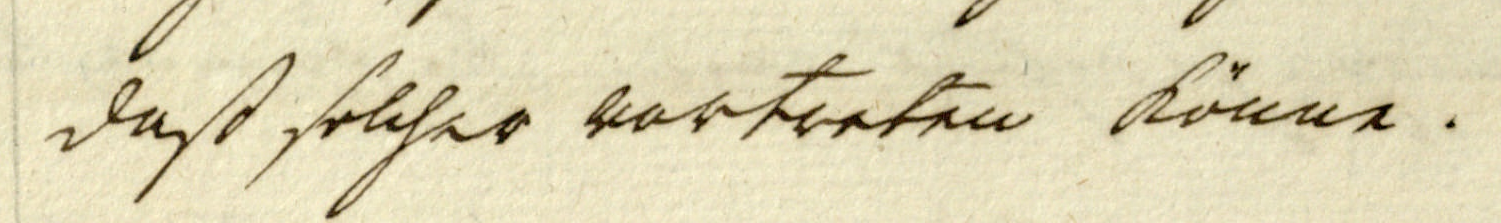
daß solcher vortreten könne.
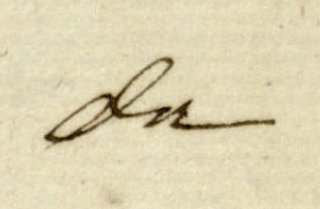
Da
